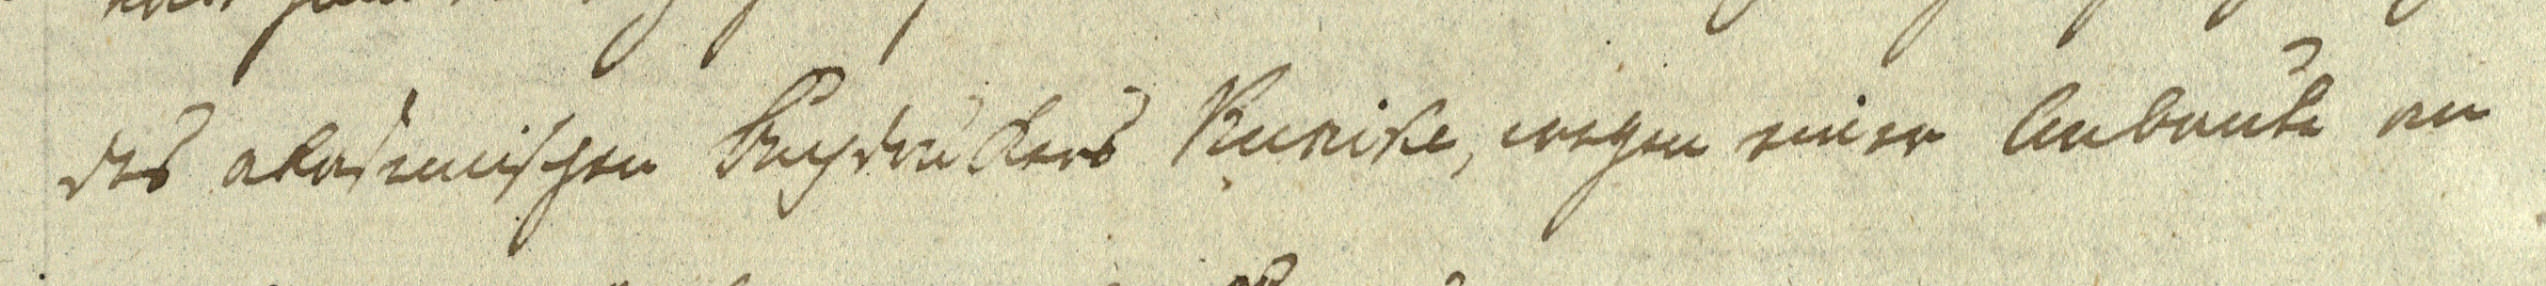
des akademischen Buchdruckers Kunike, wegen einer Anbaute an
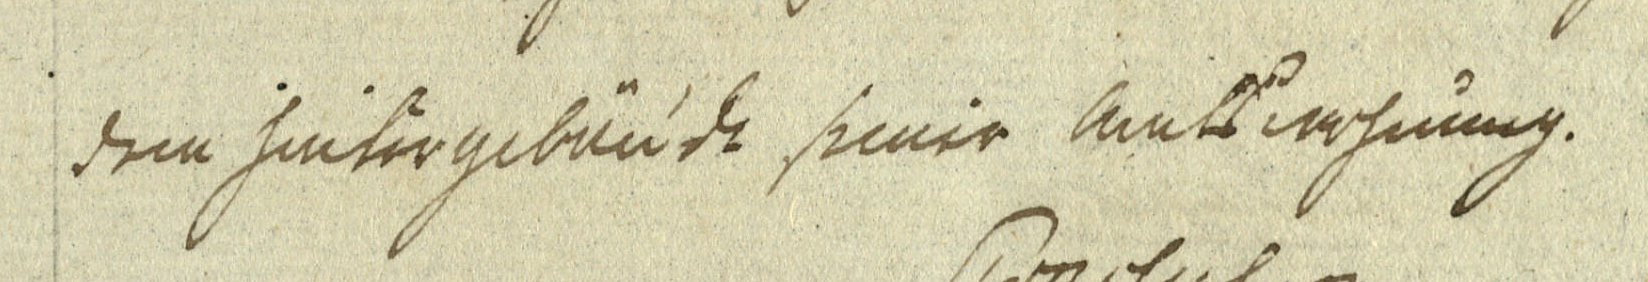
dem hintergebäude seiner Amtswohnung.
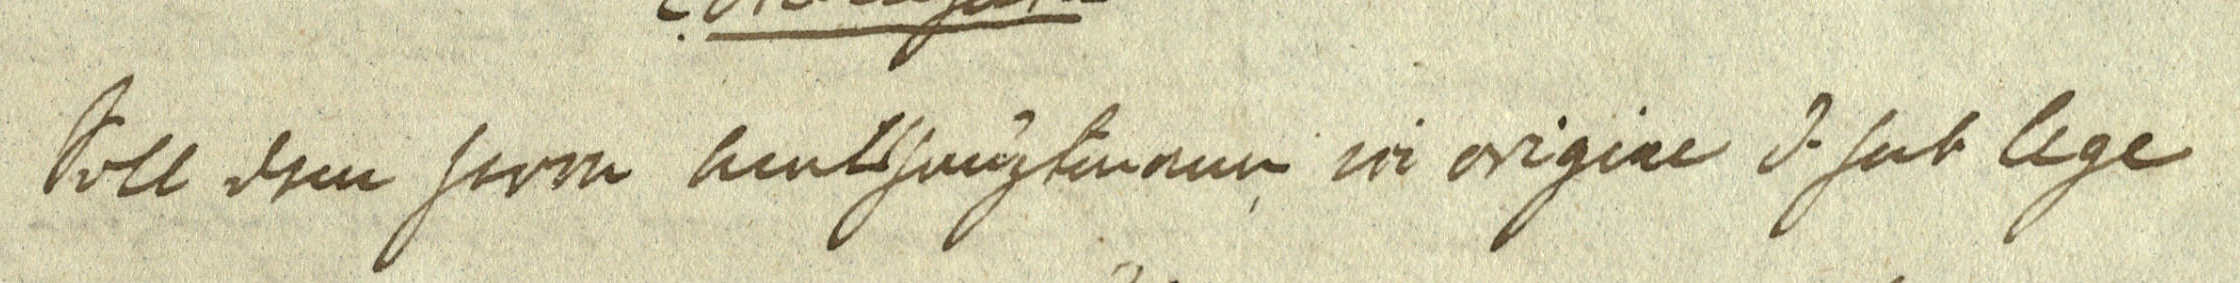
Soll dem Herrn Amtshauptmann in origine d sub lege
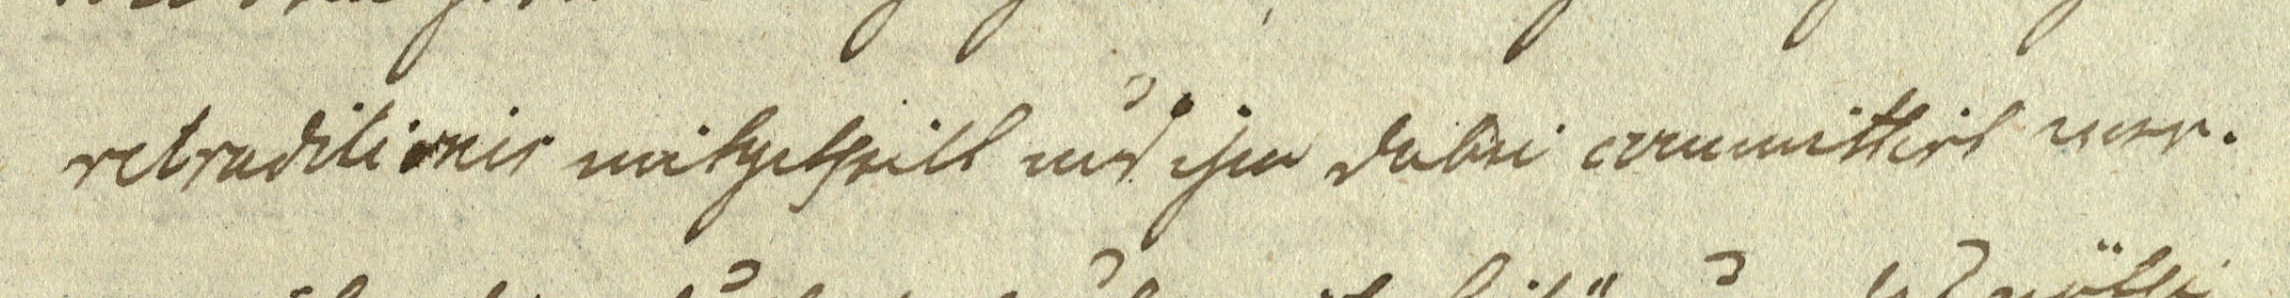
retraditionis mitgetheilt und ihm dabei committirt wer¬
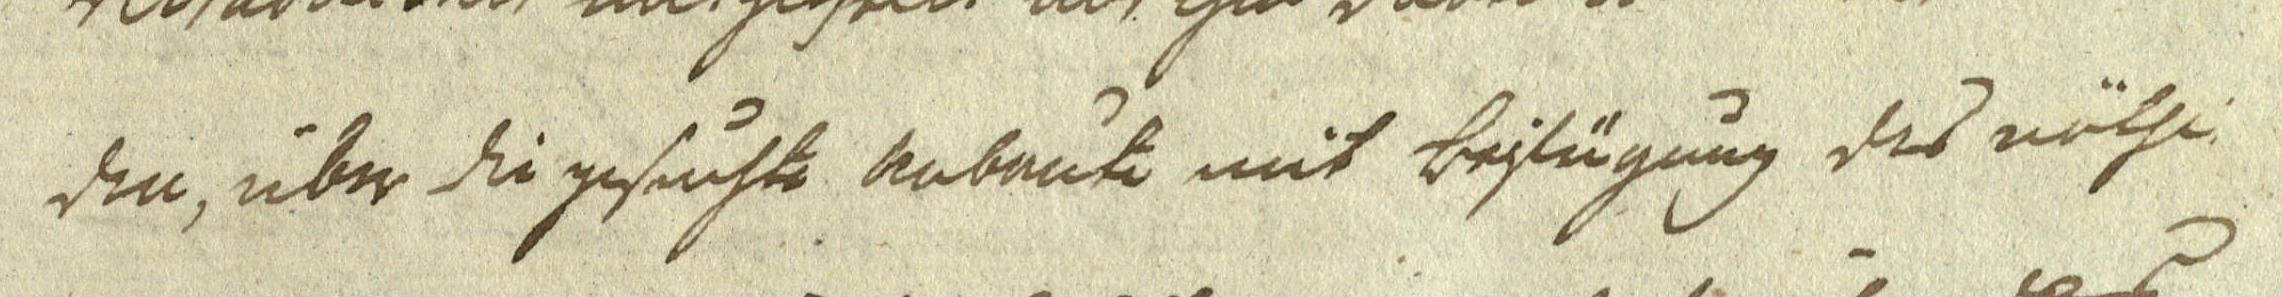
den, über die gesuchte Anbaute mit Beifügung des nöthi¬
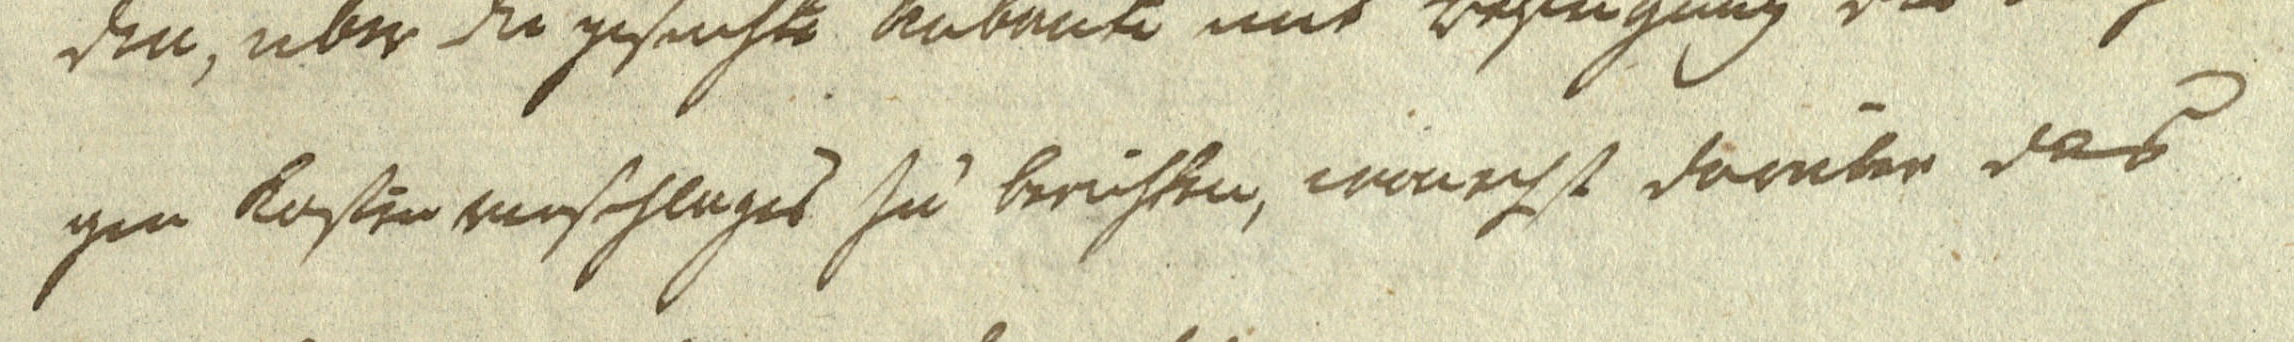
gen Kostenverschlages zu berichten, wonechst darüber das
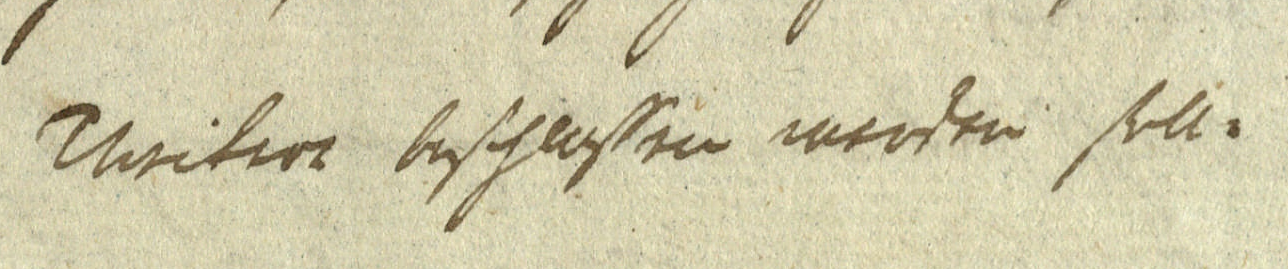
Weitere beschlossen werden soll.
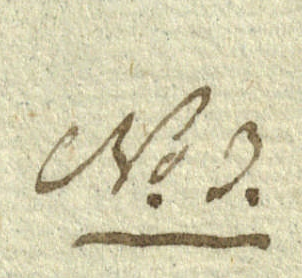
No 3.
